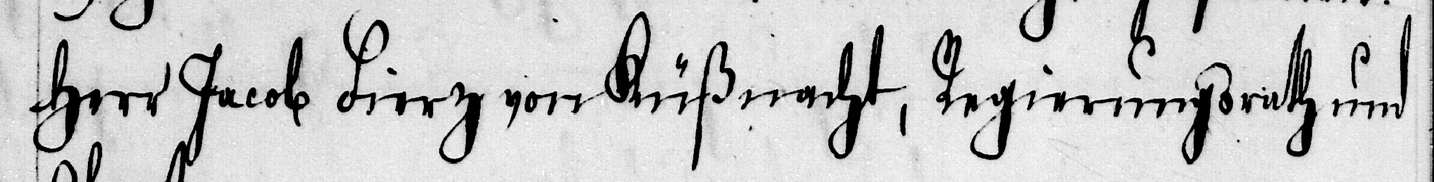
Herr Jacob Fierz von Küßnacht, Regierungsrath und
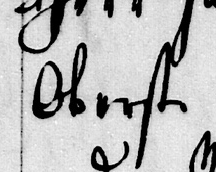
Oberst.
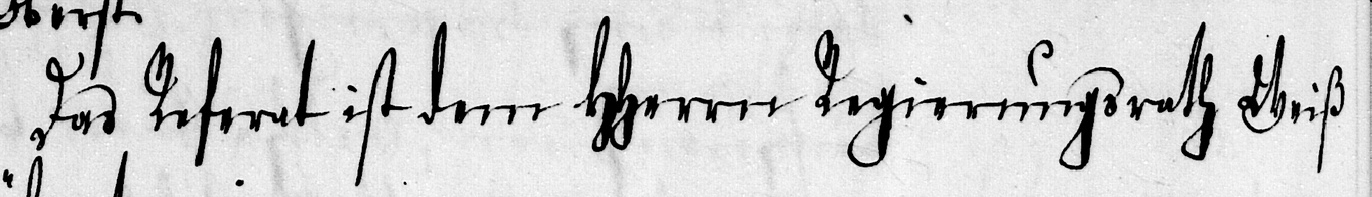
Das Referat ist dem HHern Regierungsrath Weiß
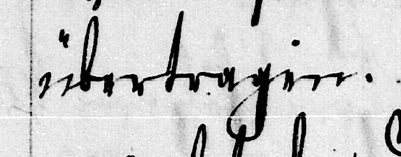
übertragen.
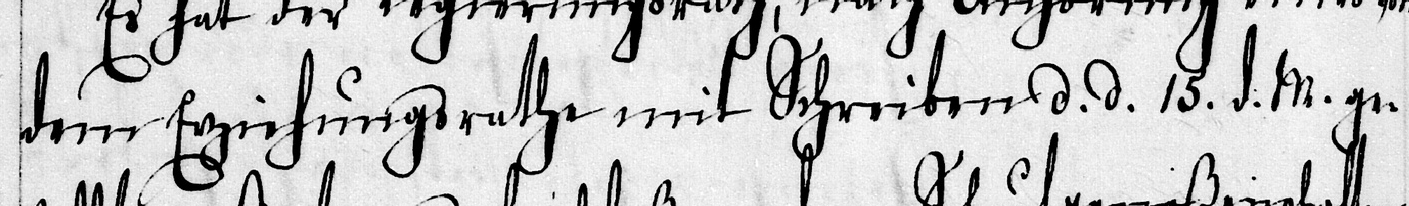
dem Erziehungsrathe mit Schreiben d. d. 15. d. M.
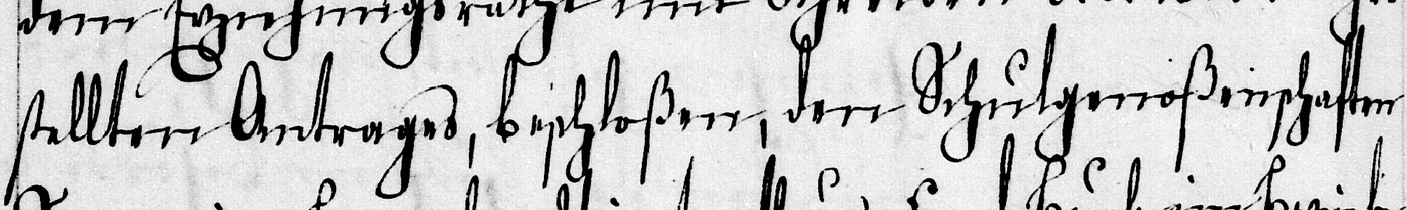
tellten Antrages, beschloßen, den Schulgenoßenschaft¬
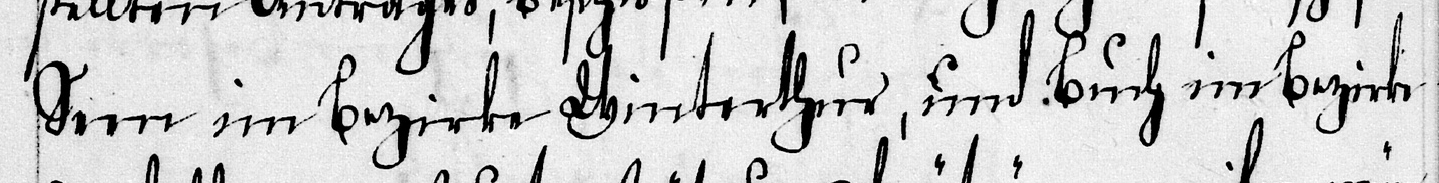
Seen im Bezirke Winterthur, und Buch im Bezirke
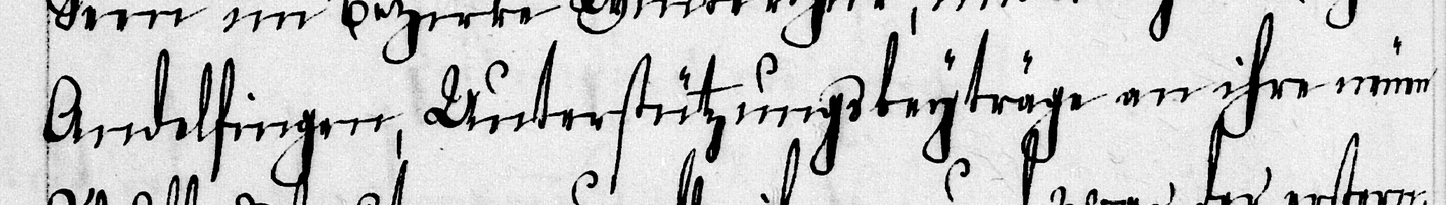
Andelfingen, Unterstützungsbeyträge an ihre neuen
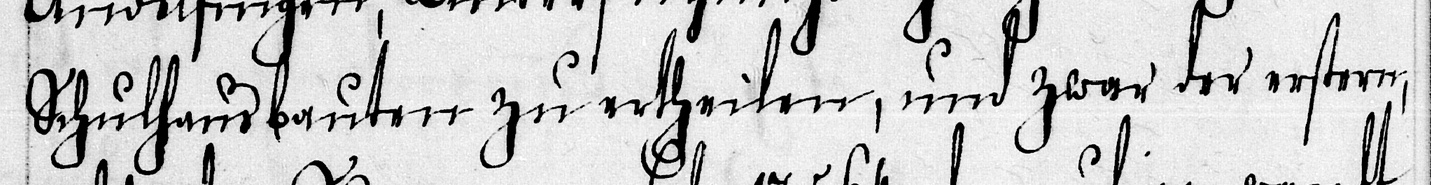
Schulhausbauten zu ertheilen, und zwar der erstern,
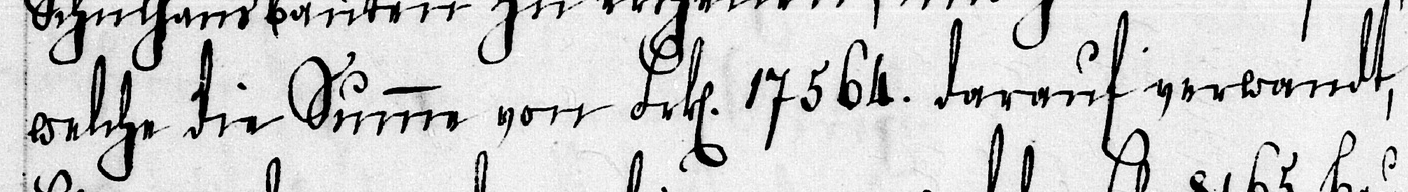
welche die Summe von Frk[en]. 17564. darauf verwandt,
